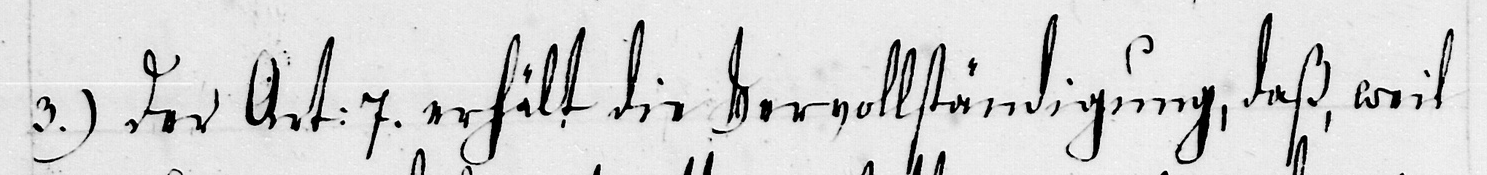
3.) Der Art: 7. erhält die Vervollständigung, daß, weil
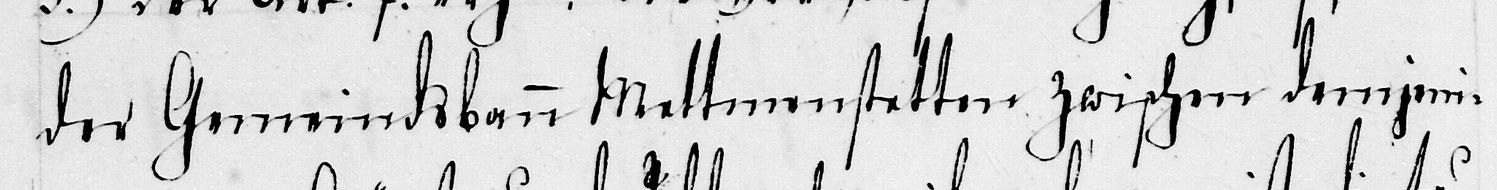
der Gemeindsbann Mettmenstetten zwischen demjeni¬
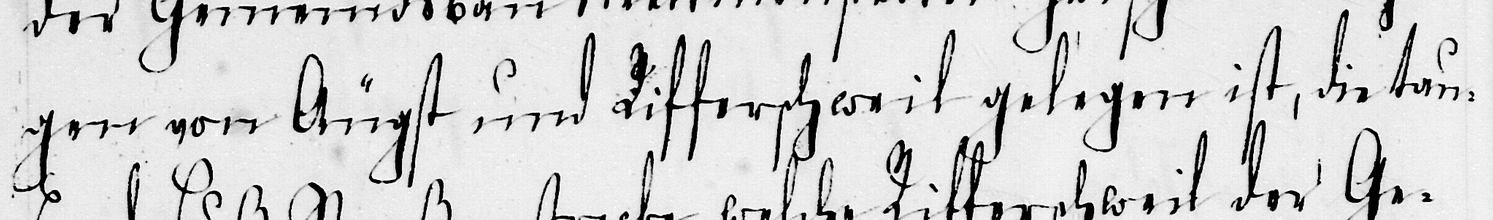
gen von Äugst und Rifferschweil gelegen ist, die tau¬
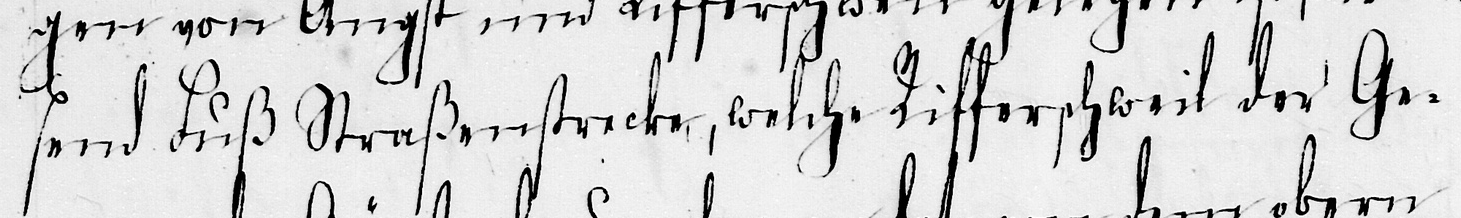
send Fuß Straßenstrecke, welche Rifferschweil der Ge¬
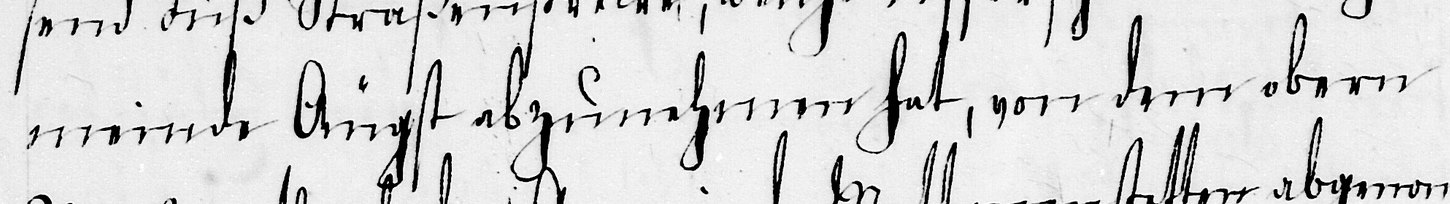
meinde Äugst abzunehmen hat, von dem obern
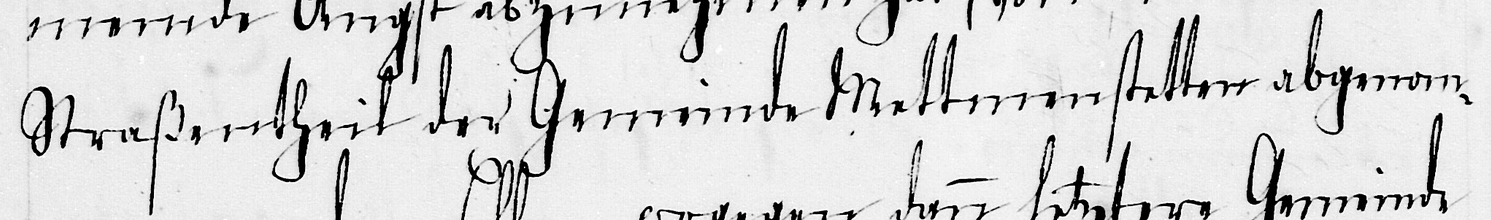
Straßentheil der Gemeinde Mettmenstetten abgenom¬
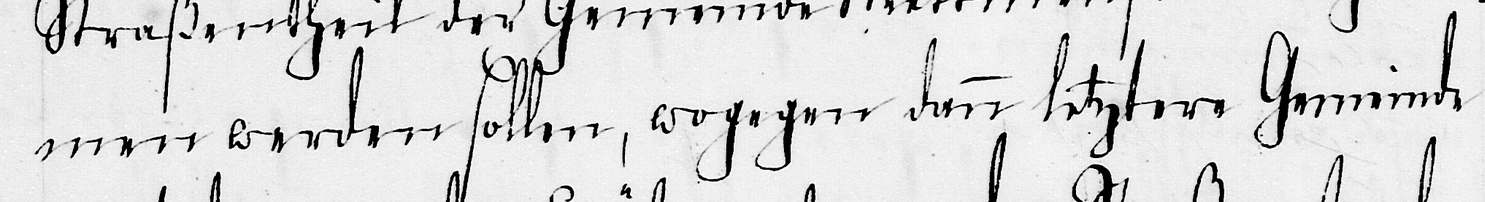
men werden sollen, wogegen dann letztere Gemeinde
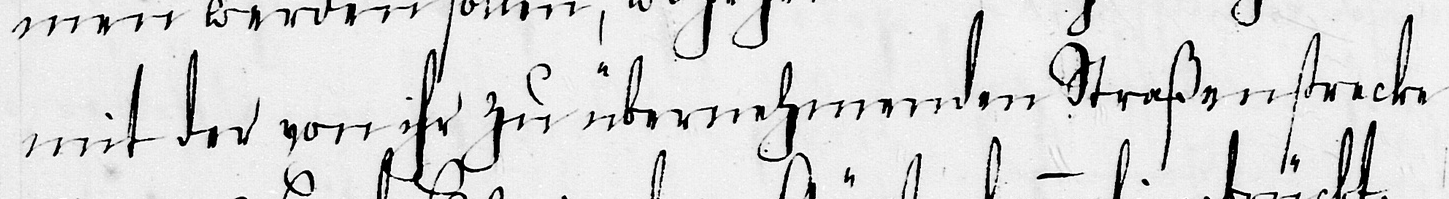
mit der von ihr zu übernehmenden Straßenstrecke
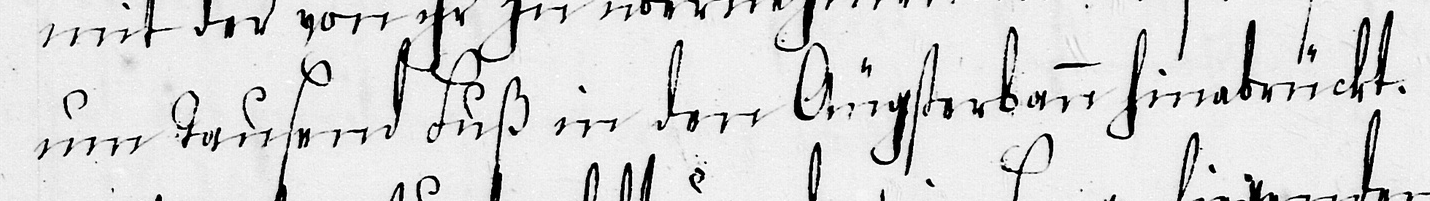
um Tausend Fuß in den Äugsterbann hinabrückt.
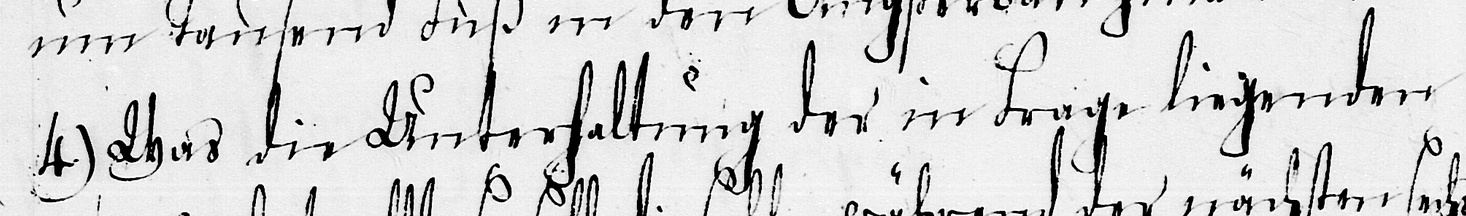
4.) Was die Unterhaltung der in Frage liegenden
